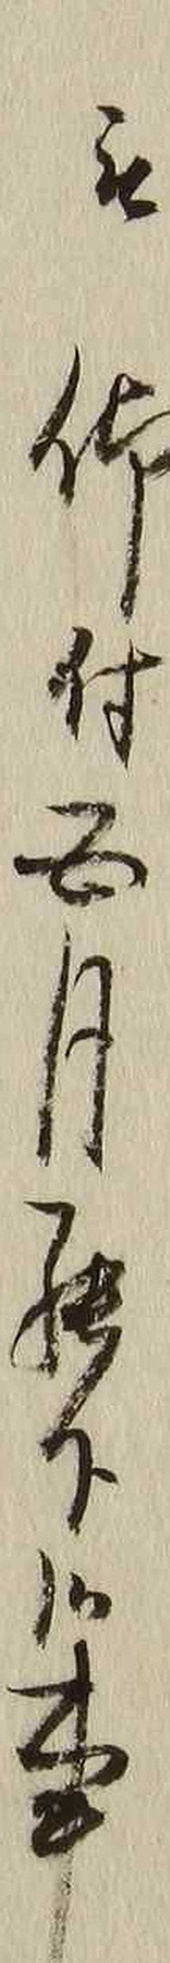被仰付五月罷下候事
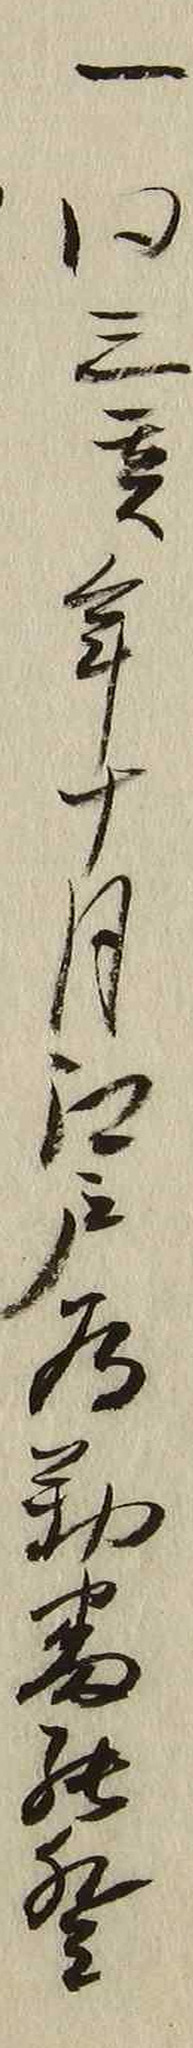一同三亥年十月江戸為勤番罷登
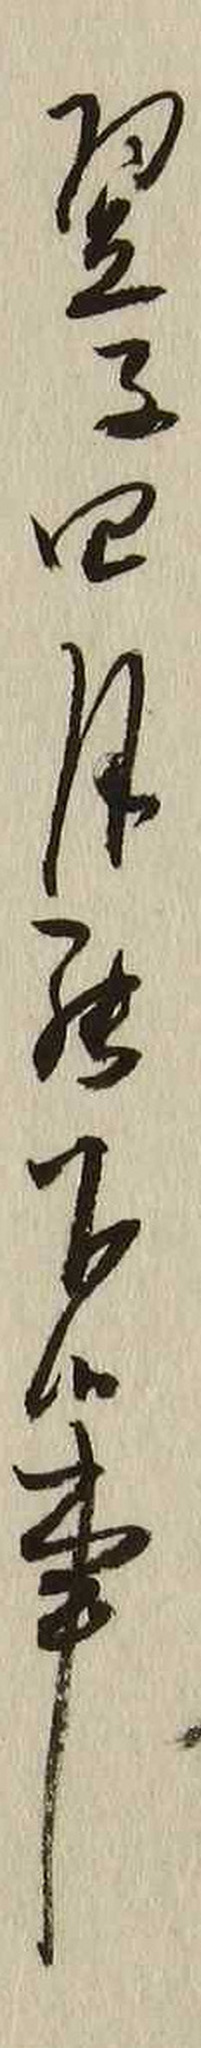翌子四月罷下候事
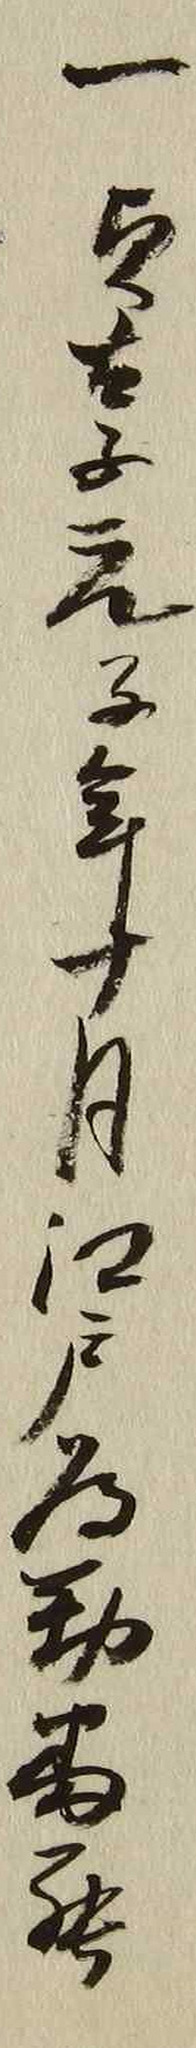一貞享元子年十月江戸為勤番罷
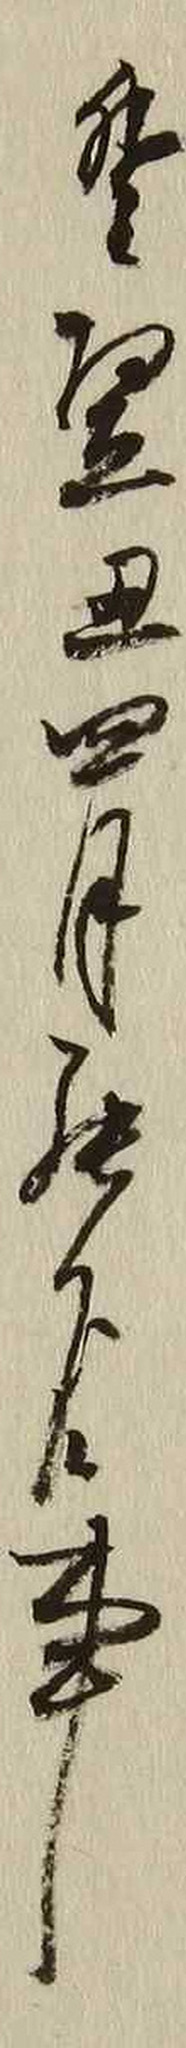登翌丑四月罷下候事
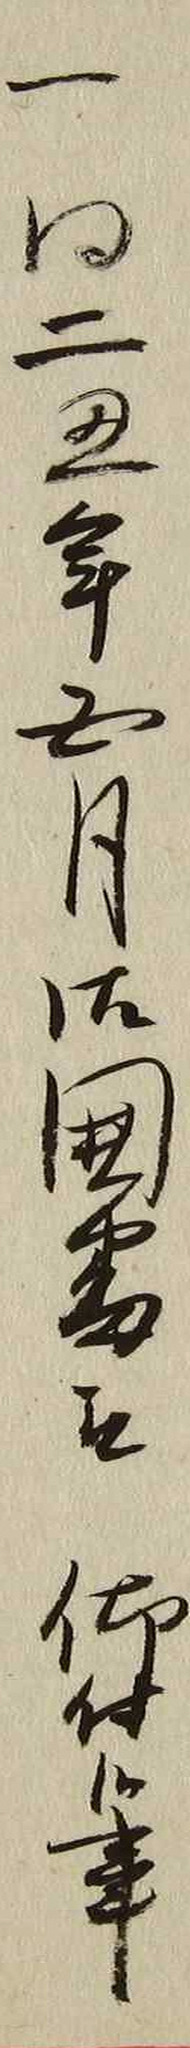一同二丑年五月御囲番被仰付候事
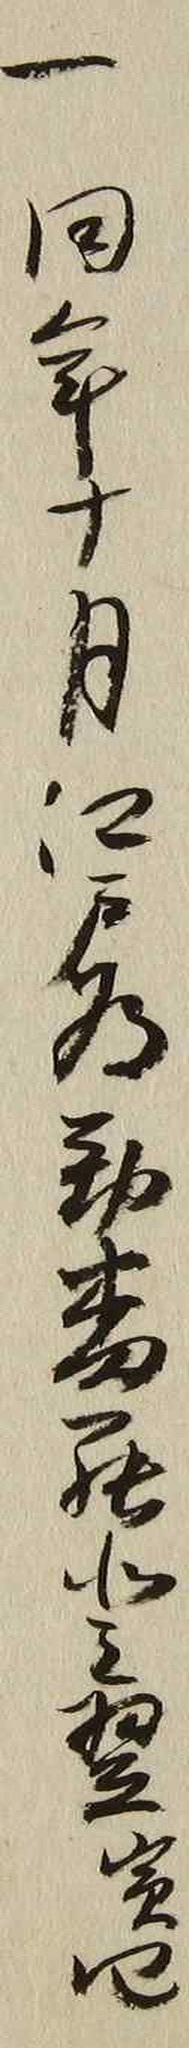一同年十月江戸為勤番罷登翌寅四
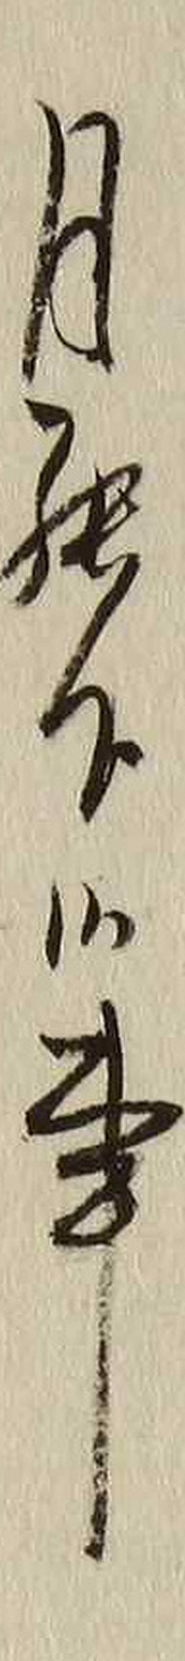月罷下候事
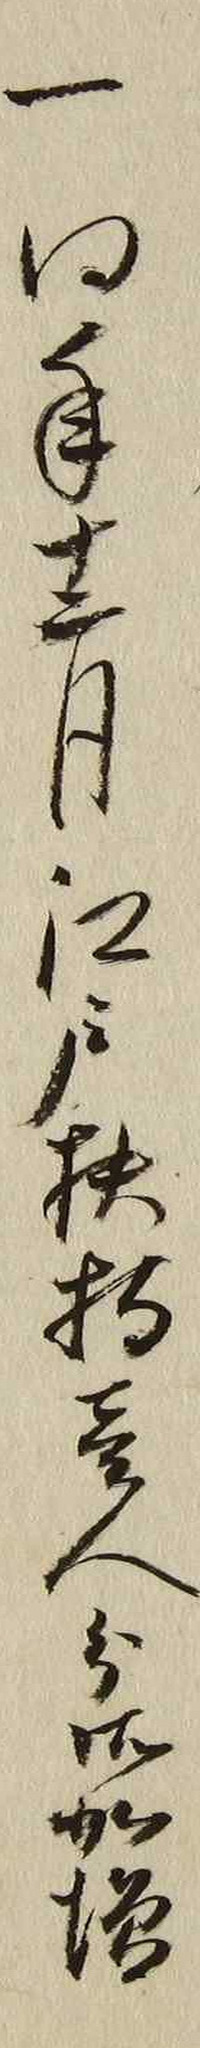一同年十二月江戸扶持壱人分御加増
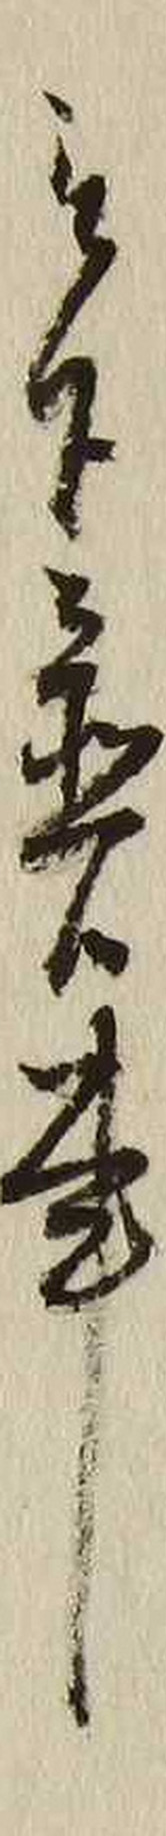被下置候事
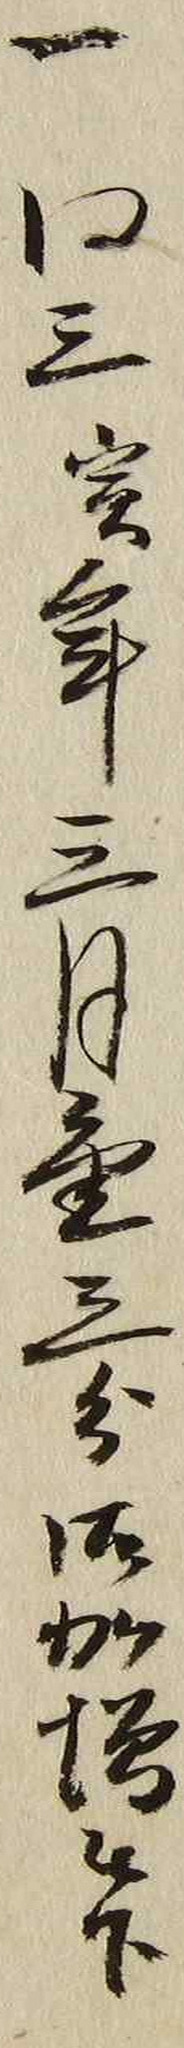一同三寅年三月金三分御加増被下
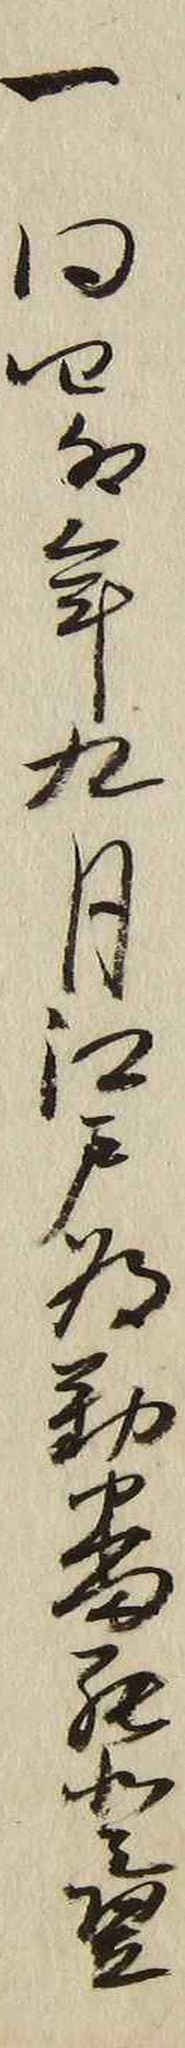一同四卯年九月江戸為勤番罷登翌
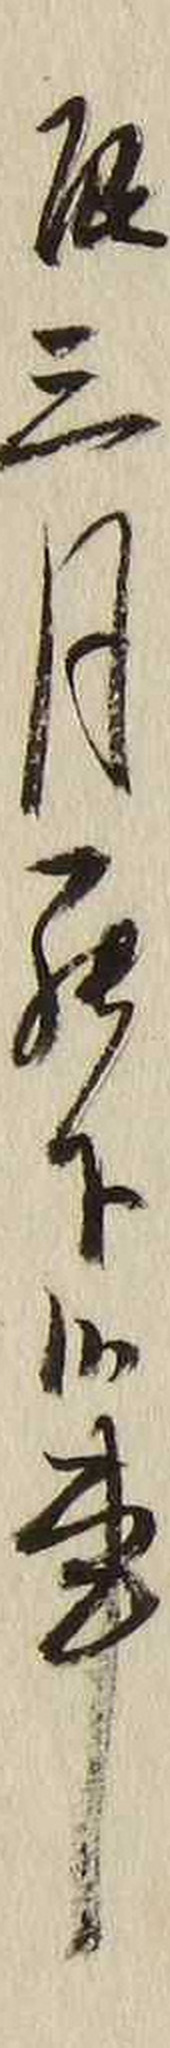辰三月罷下候事
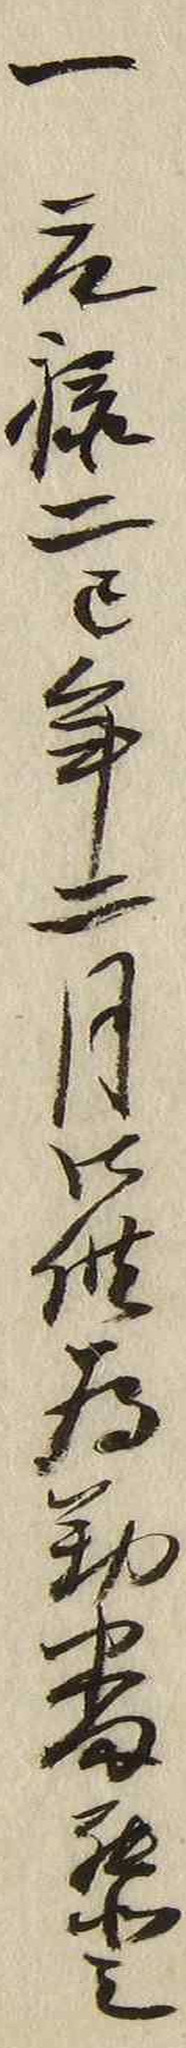一元禄二巳年二月御供為勤番罷登

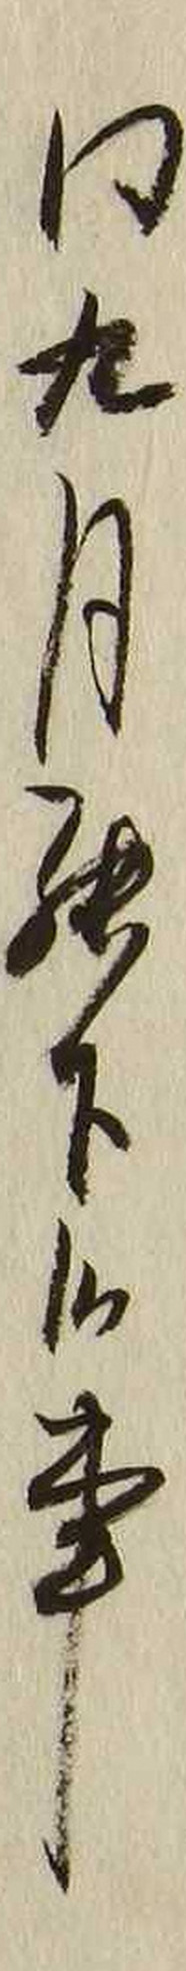同九月罷下候事
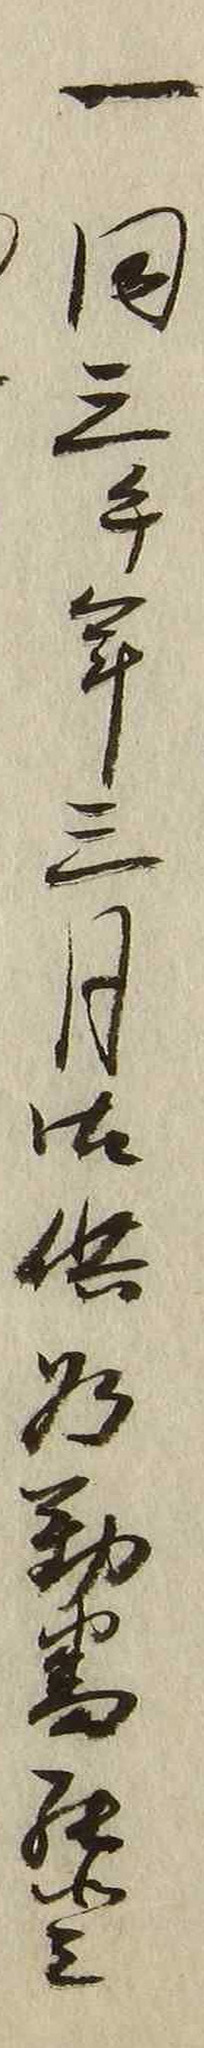一同三午年三月御供為勤番罷登
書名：諸士系譜　巻之349　も之部5
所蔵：会津若松市立会津図書館
